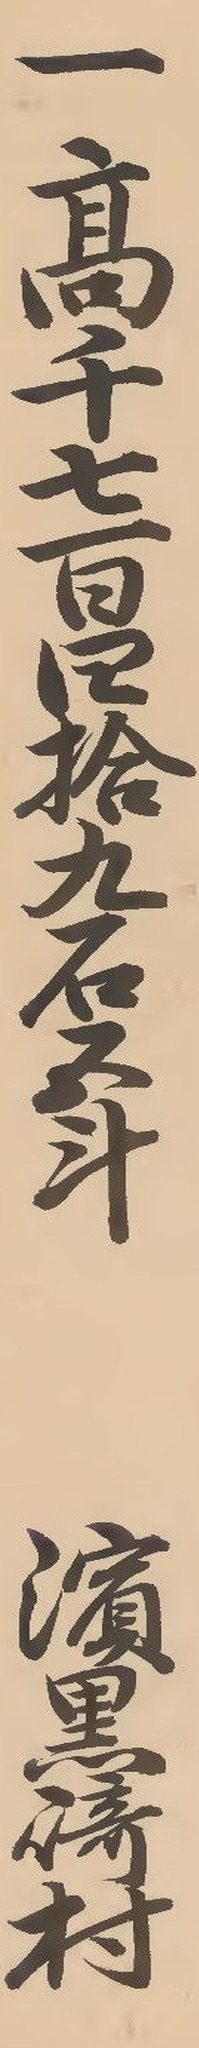一高千七百四拾九石五斗浜黒崎村

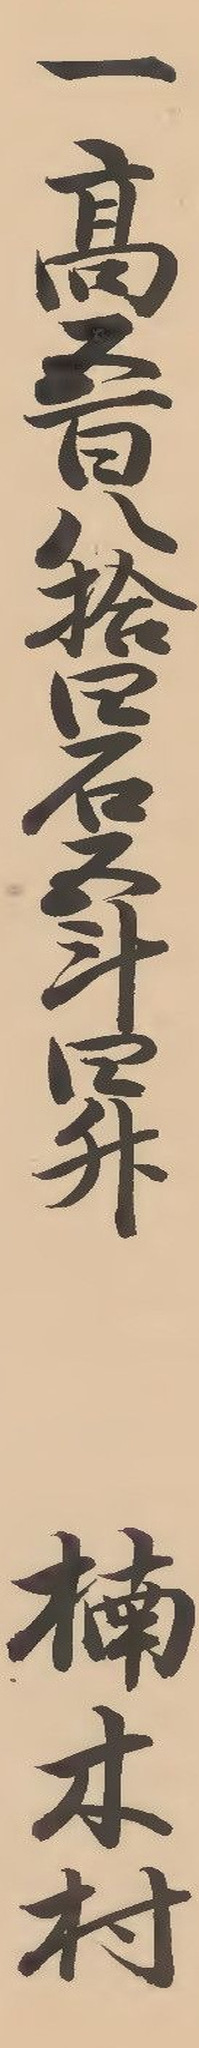一高五百八拾四石五斗四升楠木村
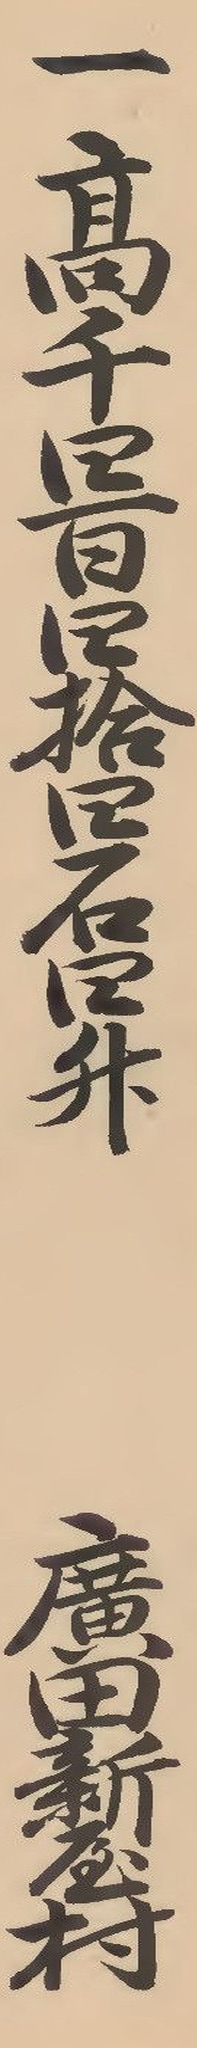一高千四百四拾四石四升広田新屋村
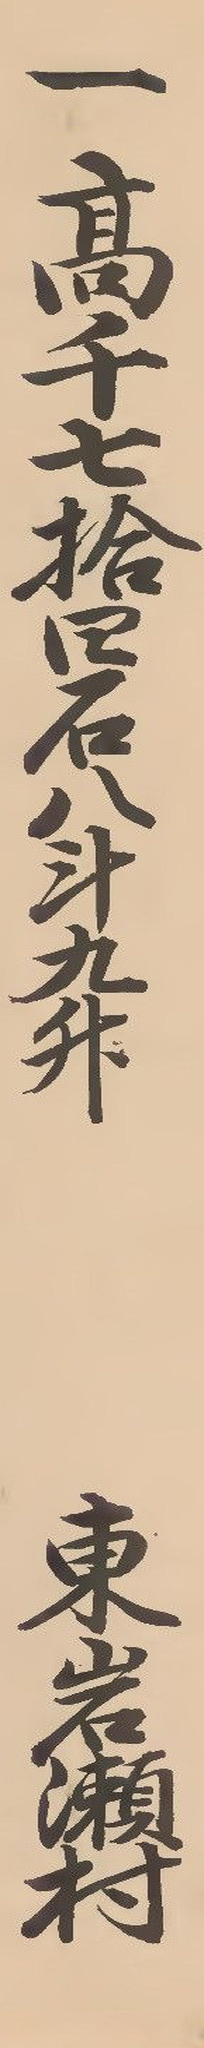一高千七拾四石八斗九升東岩瀬村
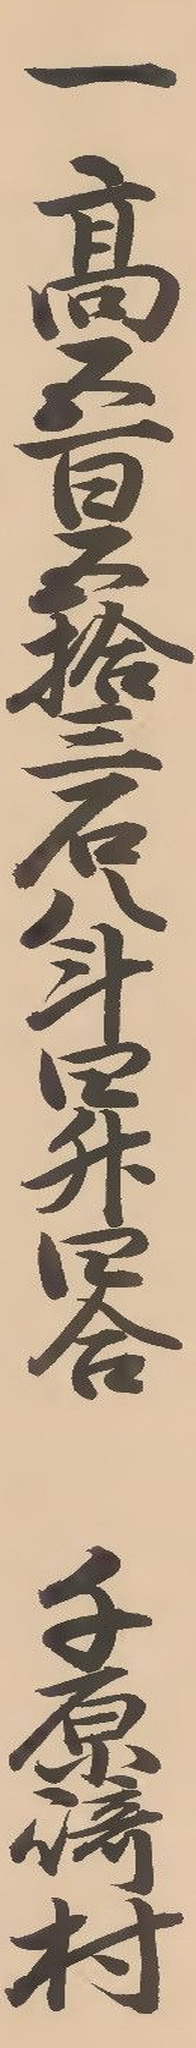一高五百五拾三石八斗四升四合千原崎村
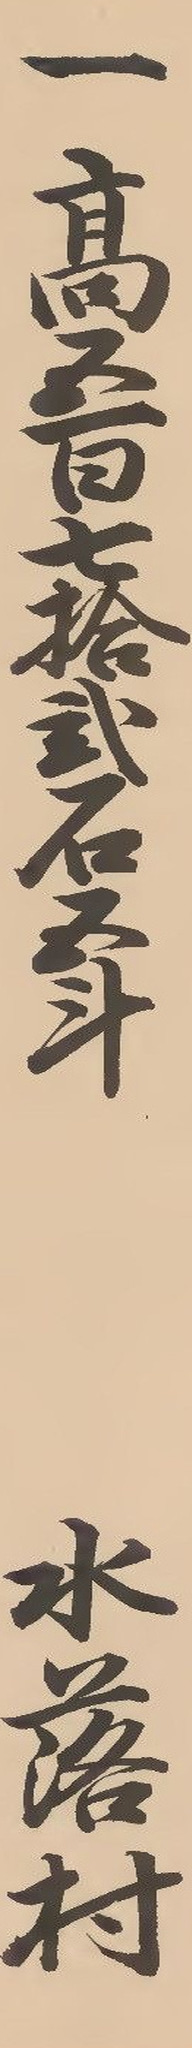一高五百七拾弐石五斗水落村
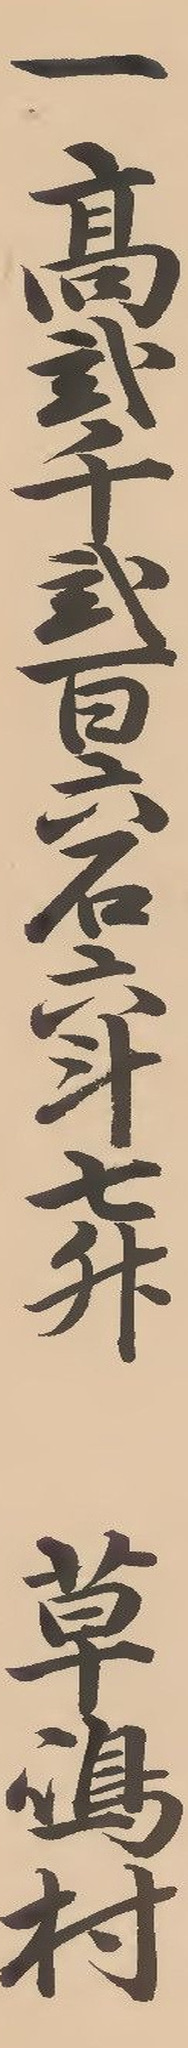一高弐千弐百六石六斗七升草島村

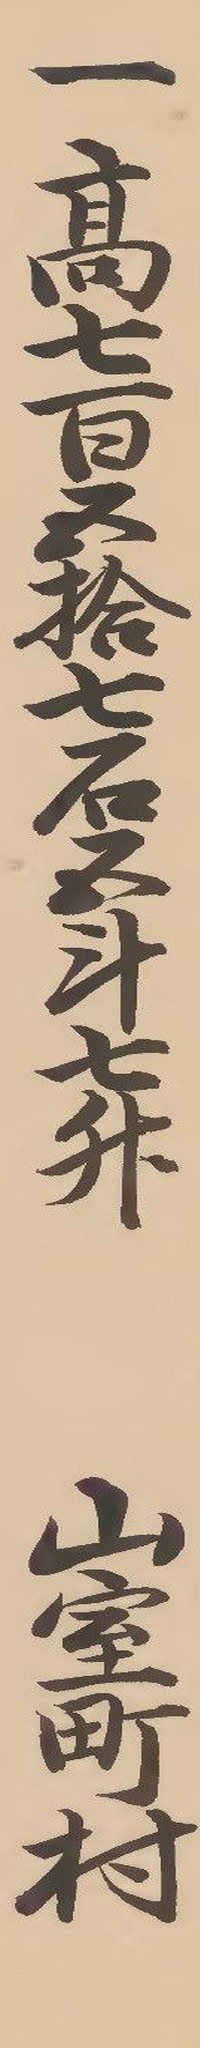一高七百五拾七石五斗七升山室町村
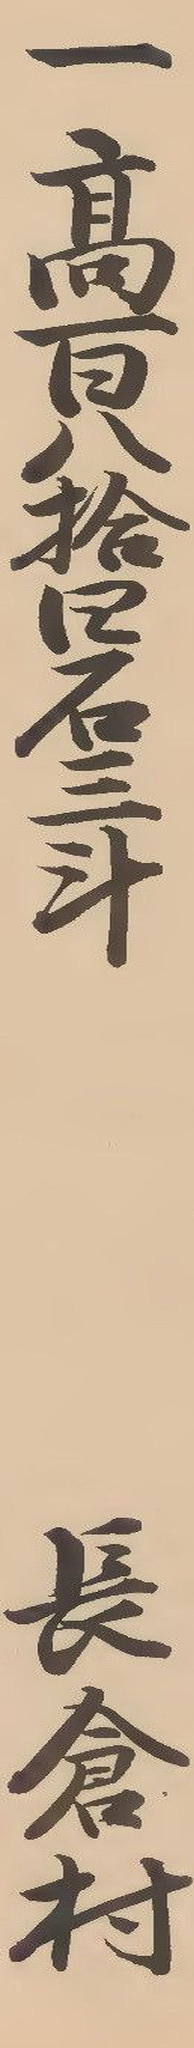一高百八拾四石三斗長倉村
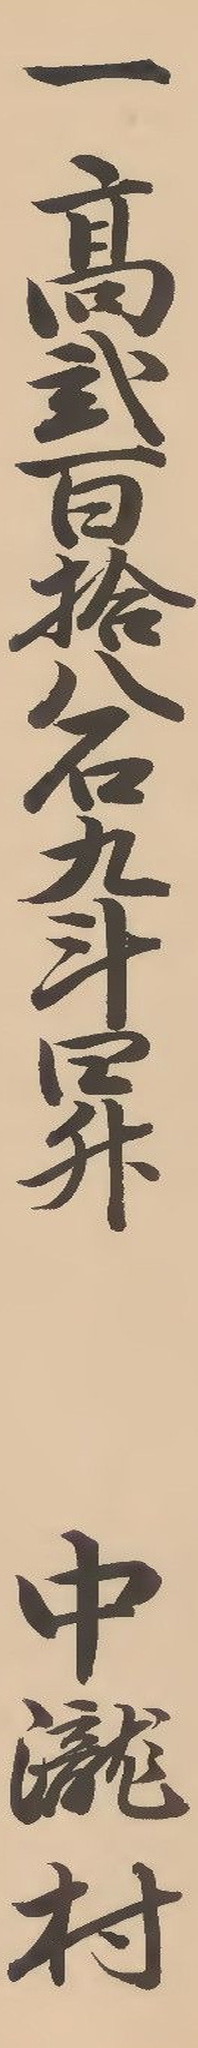一高弐百拾八石九斗四升中滝村
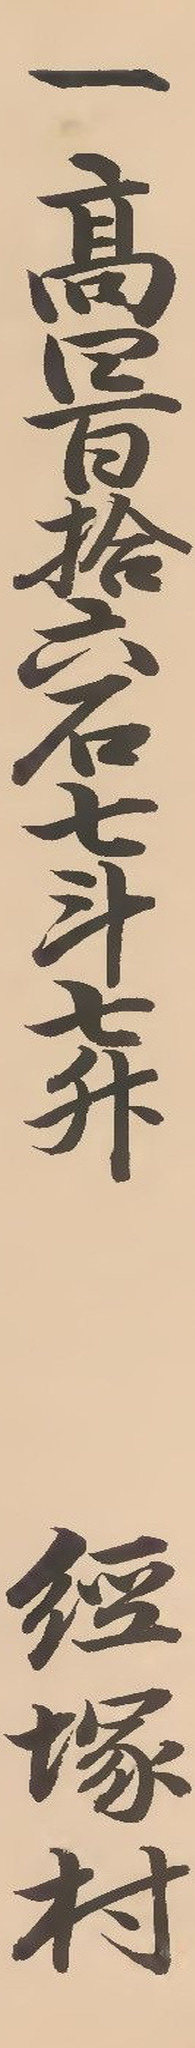一高四百拾六石七斗七升経塚村
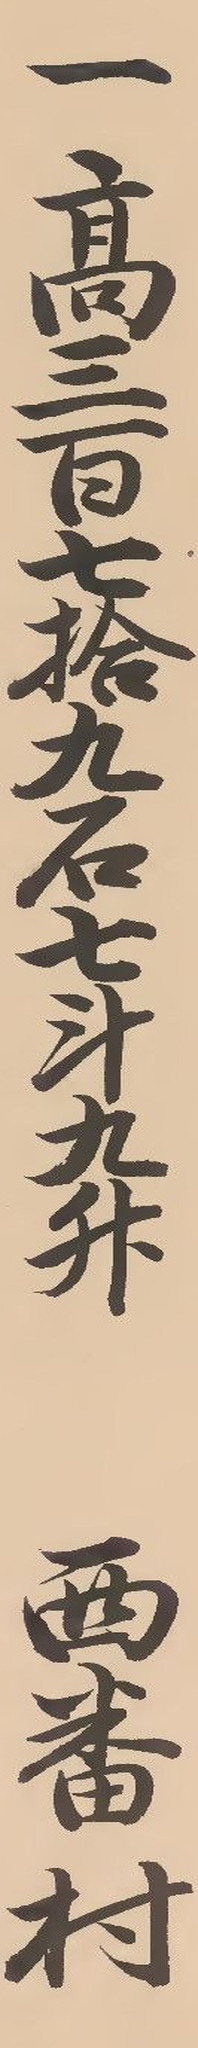一高三百七拾九石七斗九升西番村
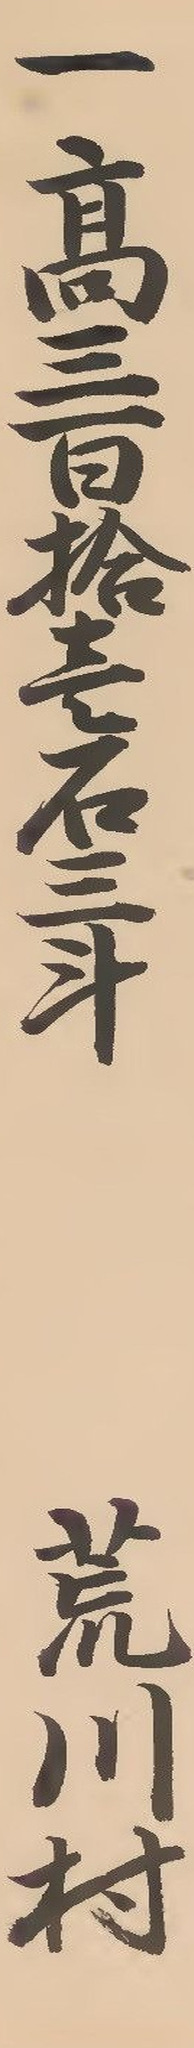一高三百拾壱石三斗荒川村

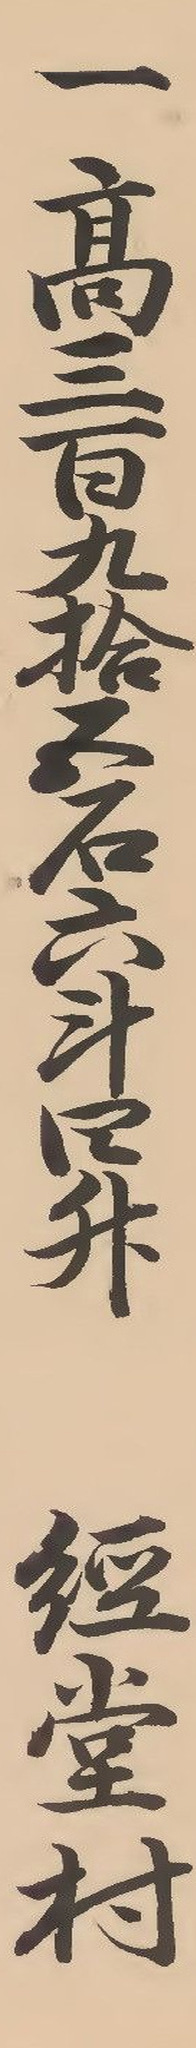一高三百九拾五石六斗四升経堂村
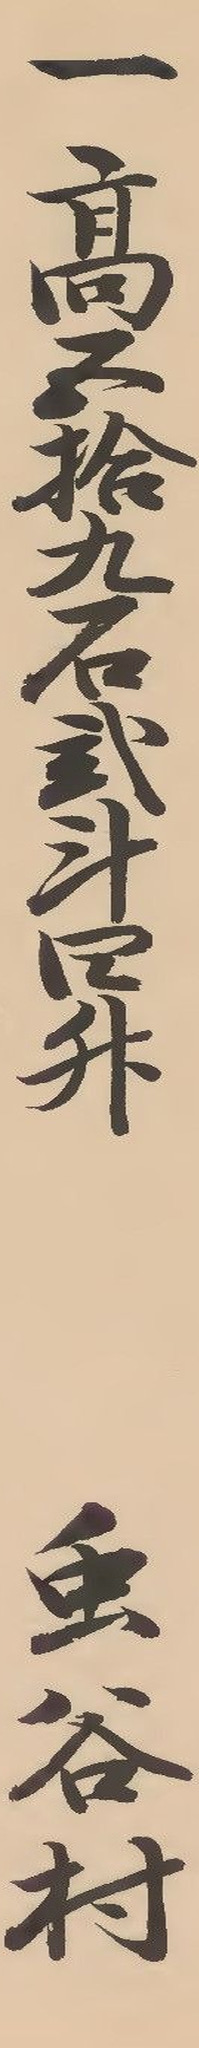一高五拾九石弐斗四升虫谷村
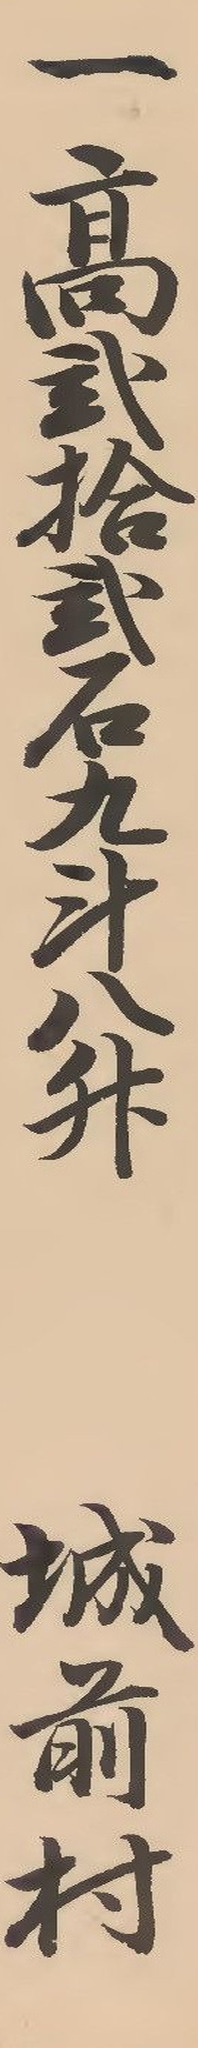一高弐拾弐石九斗八升城前村
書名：越中国郷帳
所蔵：国立公文書館 National Archives of Japan
